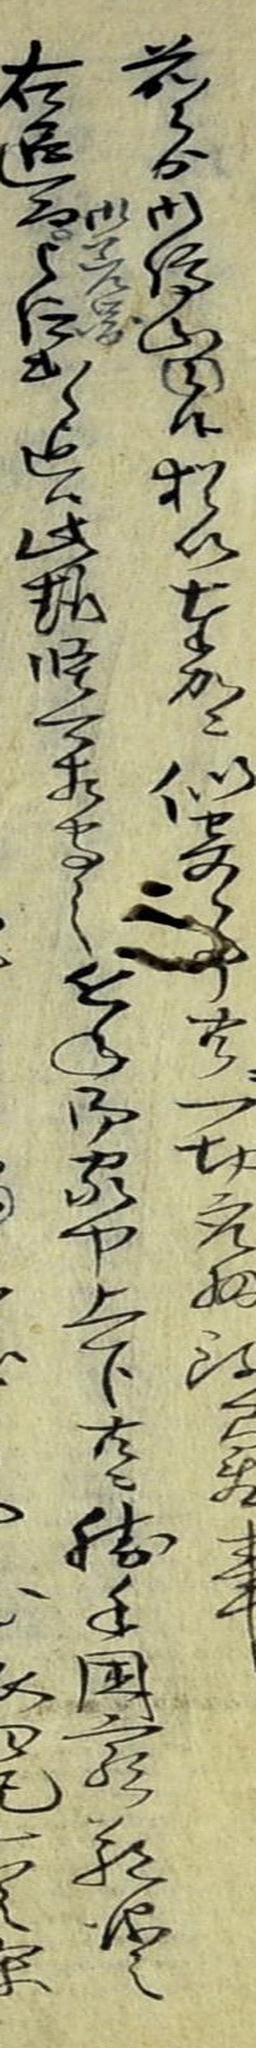右追而◦御差図被仰出候迄ハ此趣堅可相守之近年御家中上下共ニ勝手困窮難儀之
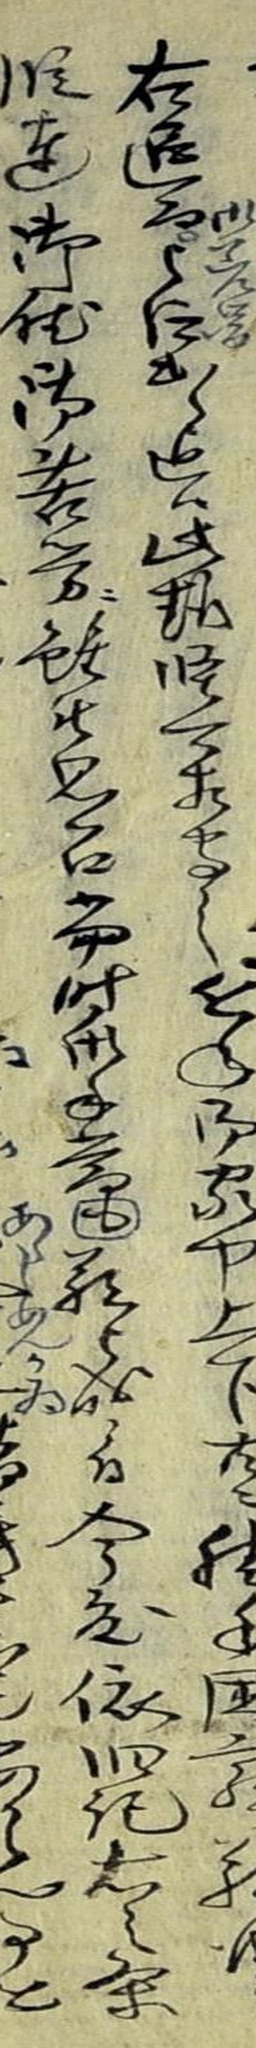段達御聴御苦労ニ雖被思召当時御手当も難被成ニ付今度依旧記右之条
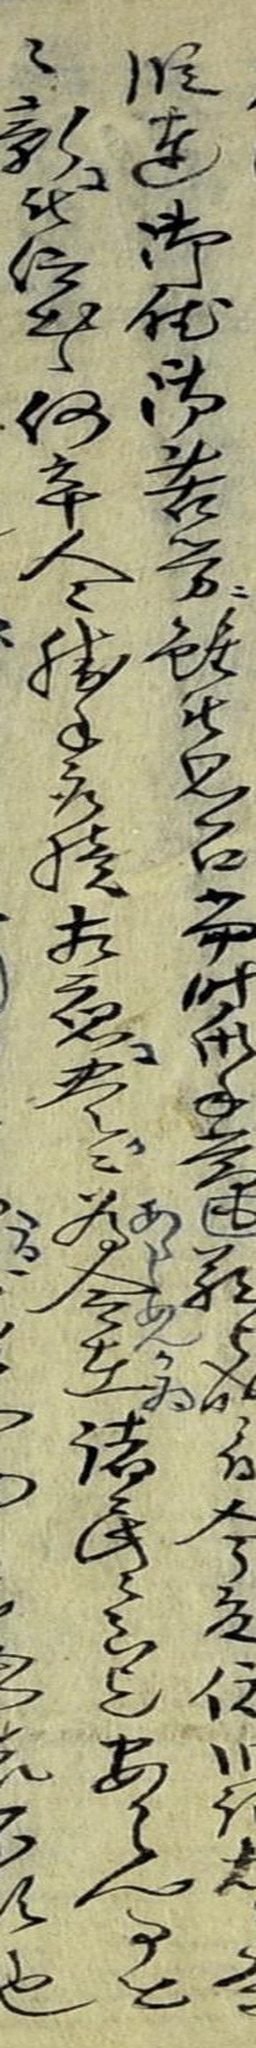々新に被仰出候何卒人々勝手取続相応に豊かニ為令在諸民ニ至迄安からん事を
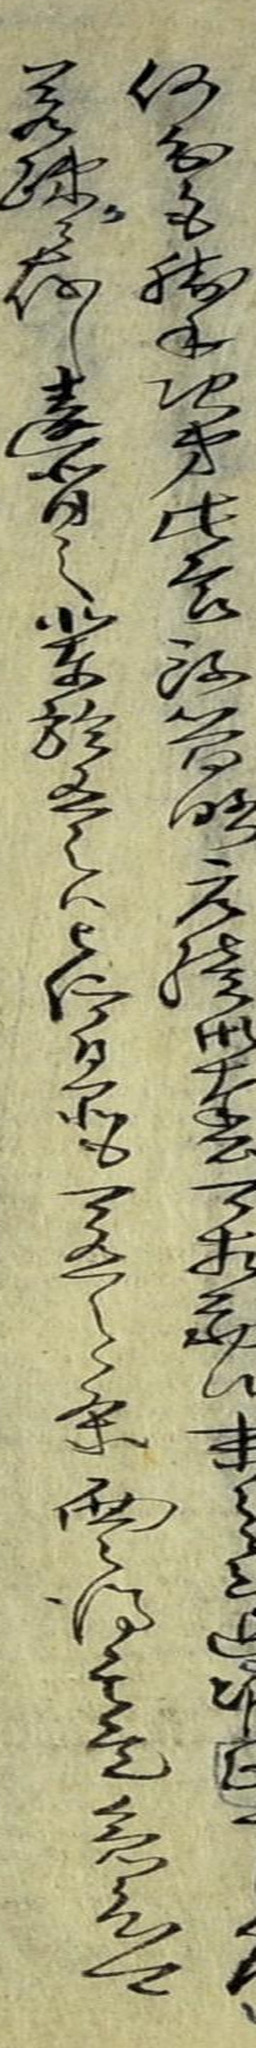若疎かニ存し違背之輩於有之ハ被仰付品も可有之候条面々得其意急度可
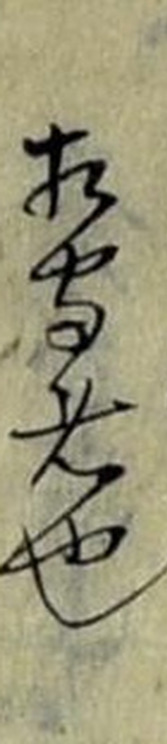相守者也
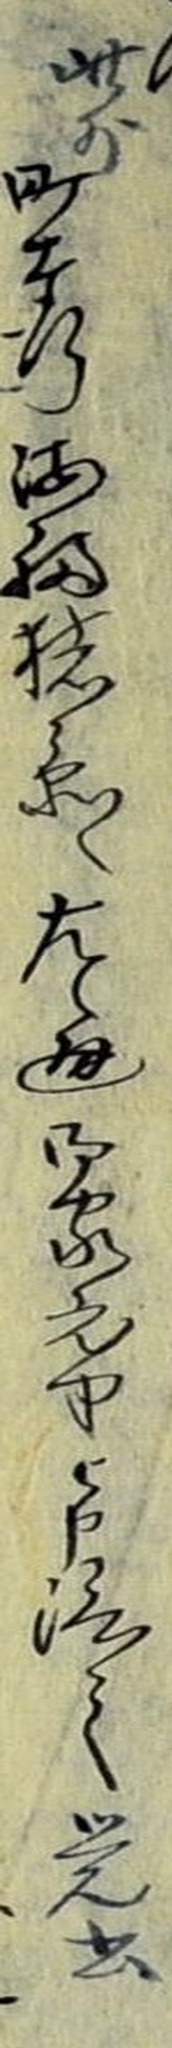此外町奉行海福猪兵衛へ左之通御家老中被申渡之覚書
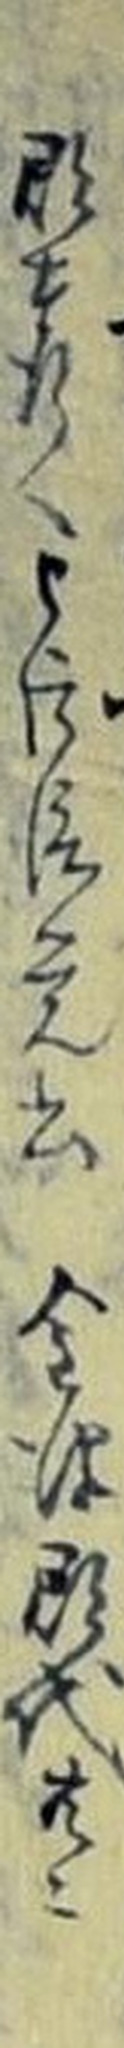郡奉行へ被仰渡覚書金津郡代共ニ
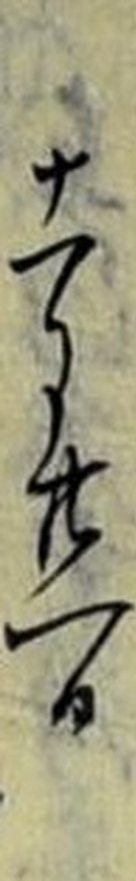十一月廿一日
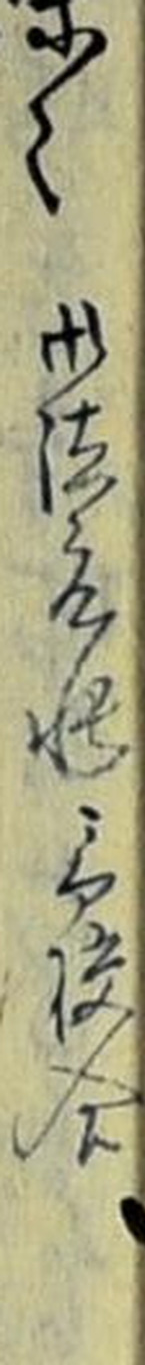条々御法度帳ニ而校合
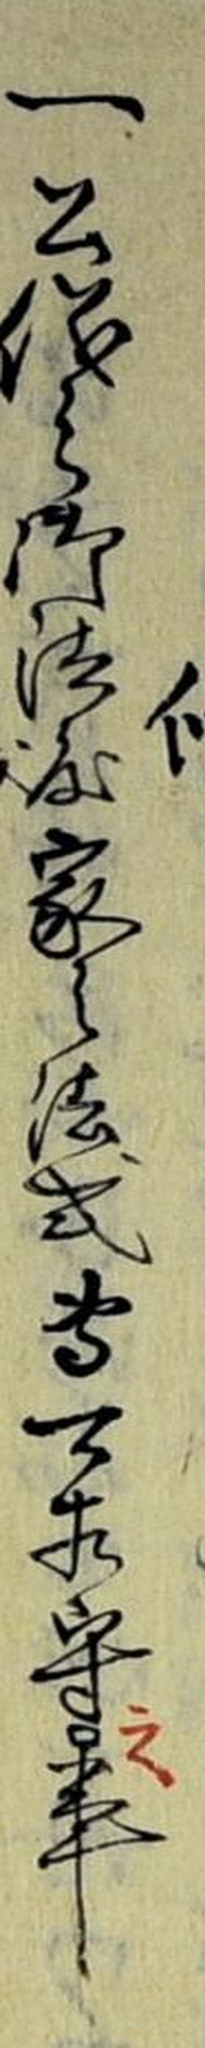一公儀之御法度家之法式専可相守◦之事
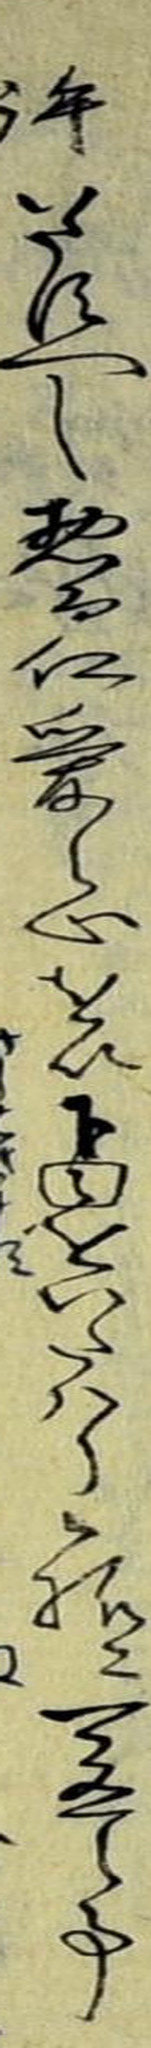許いたすへし惣而仁愛之心を以下々をいたハり候様ニ可有之事
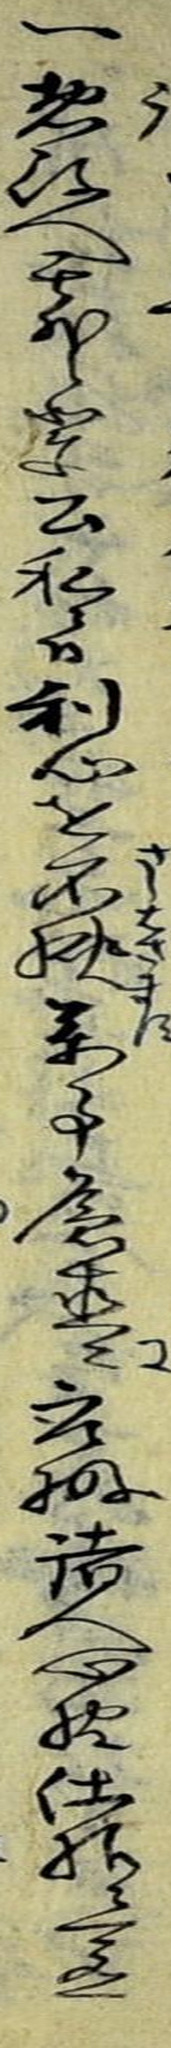一惣役人其外之輩公私ニ付利心を不挟万事廉直ニ取扱諸人心服仕様ニ可有
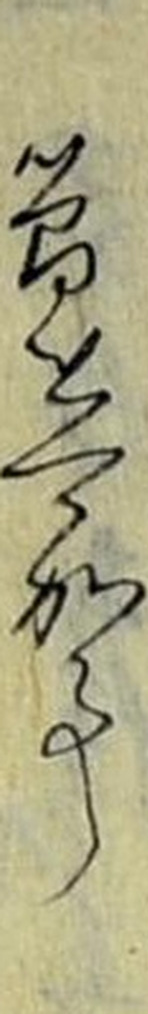簡を可加事
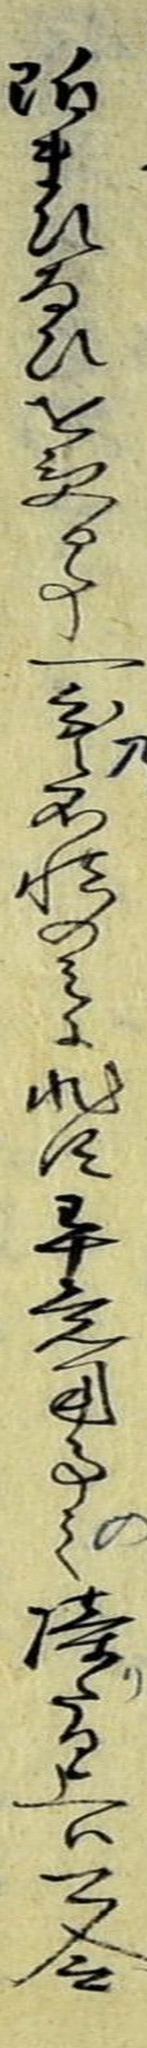附まひなひを受る事一分之不慎のみに非す畢竟用事之障りたる上ハ可令
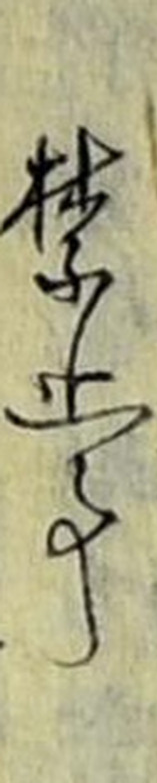禁止事

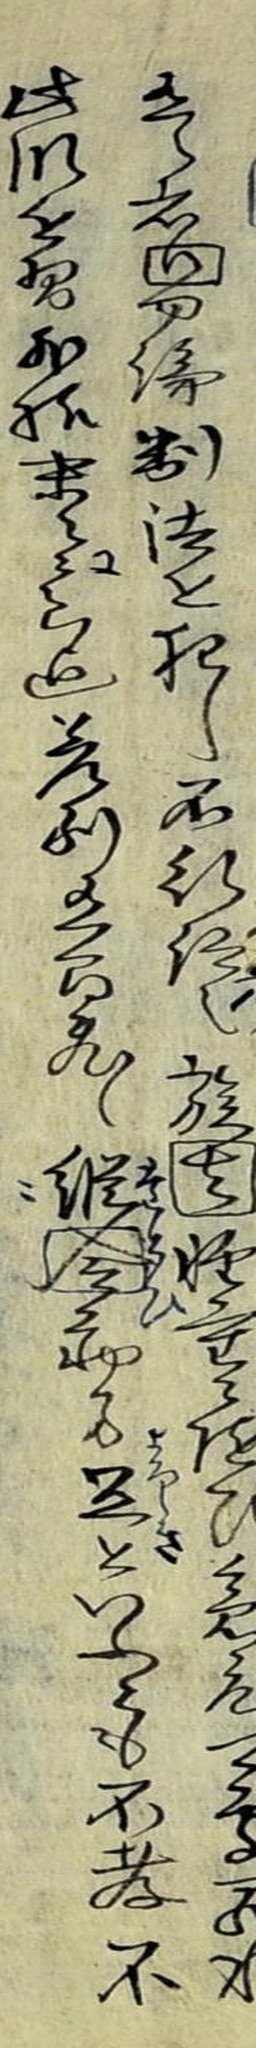此段近習外様末々ニ至迄差別有間敷候縦令勤方宜といふとも不孝不
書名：命令之部 一
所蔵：福井県文書館 Fukui Prefectural Archives
